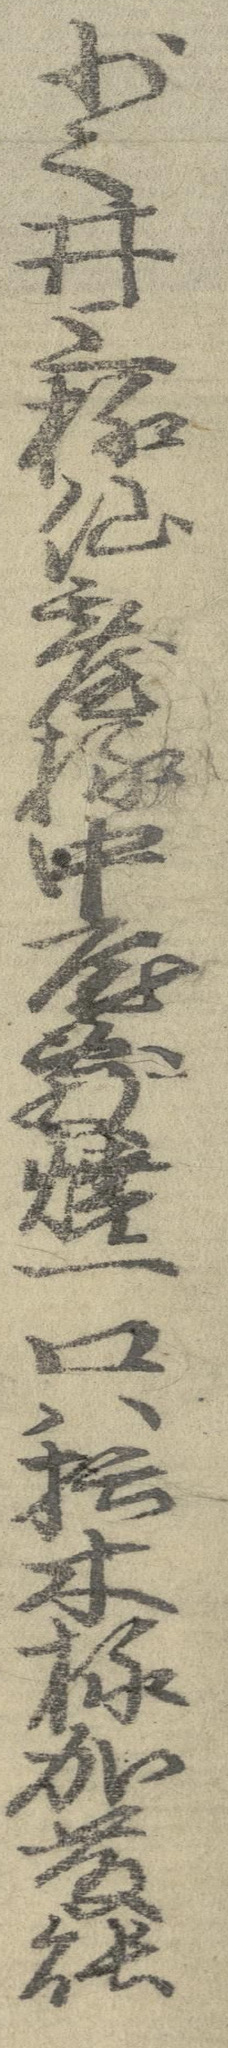少々井上様仙台様中屋敷焼一口は松木様加藤能
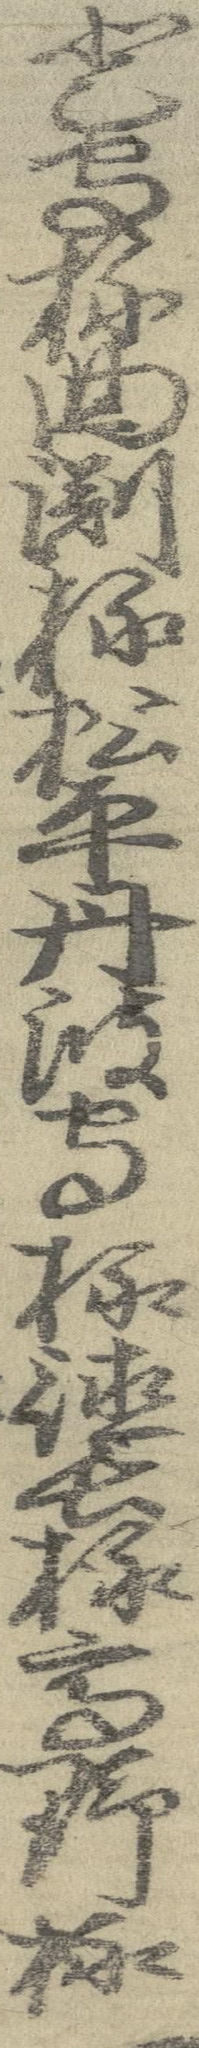登守様曲淵様松平丹波守様徳長様高野様
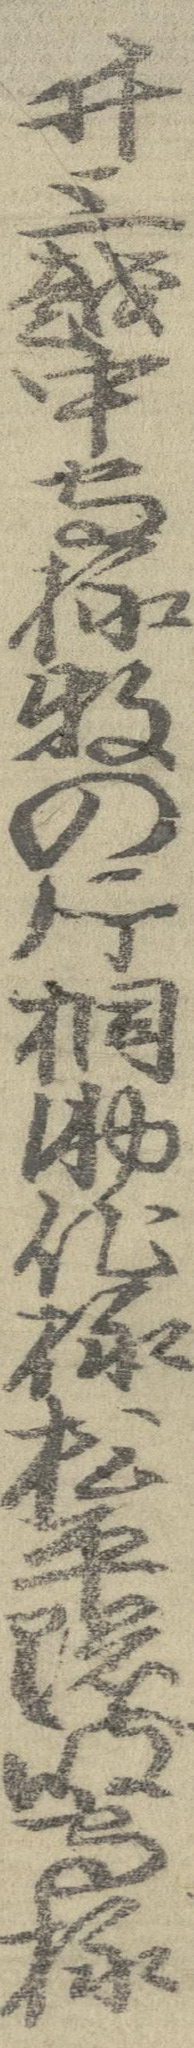井上越中守様牧の片桐助作様松平隠岐守様
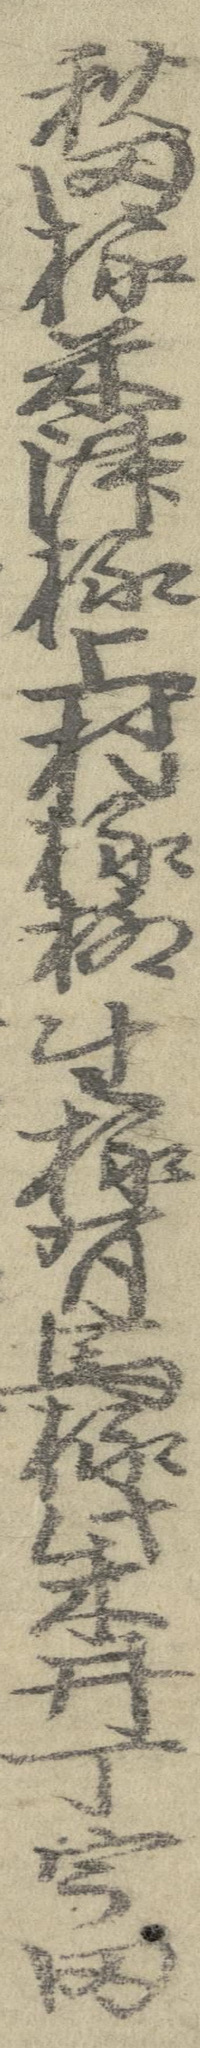秋田様米津様上村様柳生様有馬様柴井丁宇田
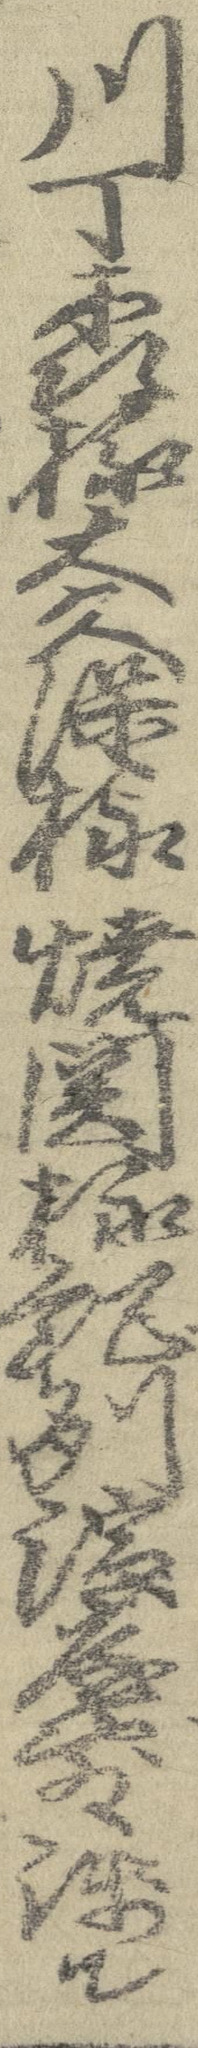川丁森様大久保様焼関様紀州濱屋敷残ル
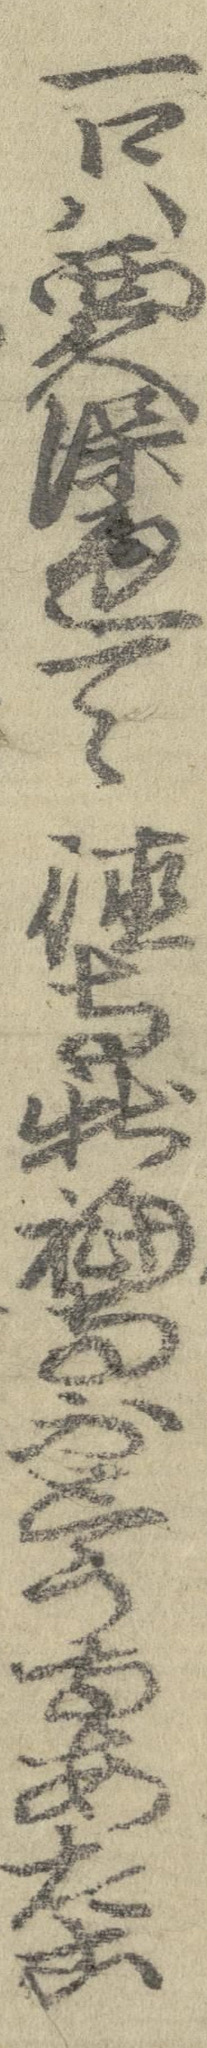一口は西久保通天徳寺新福寺ふとう南あたこ
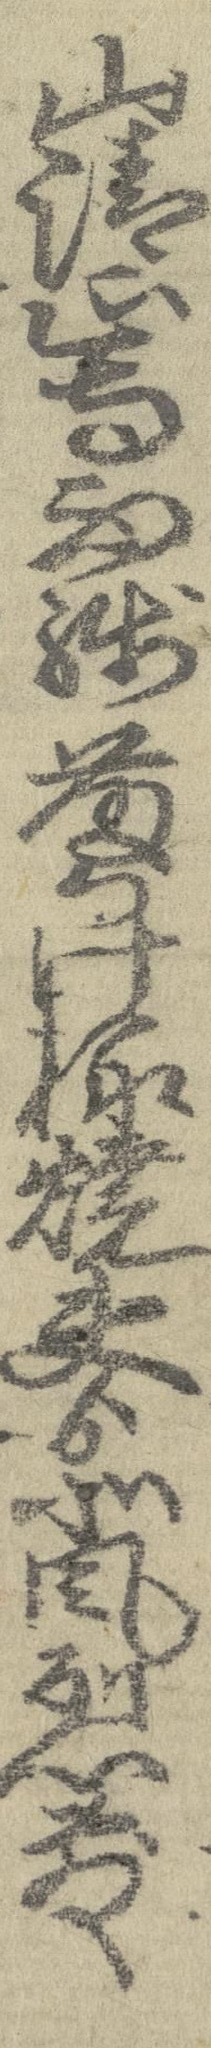山清正寺不残藤かけ様焼夫ゟ北風烈敷
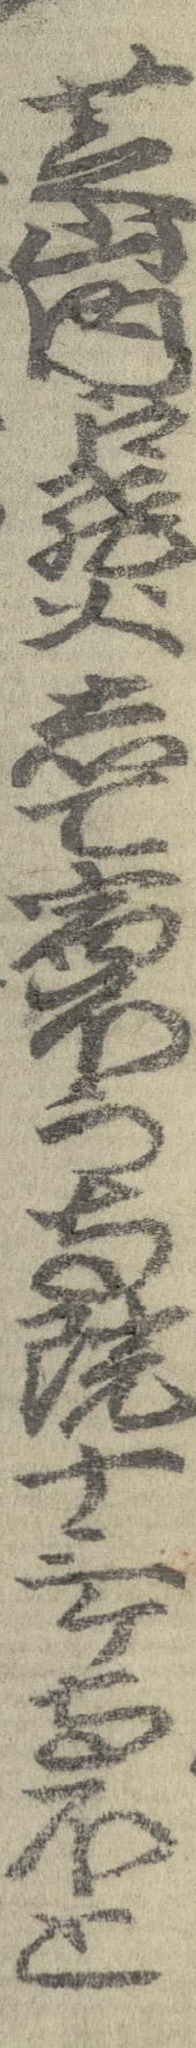芝山門江飛火して宿ほう寺院十三ケ寺ほと
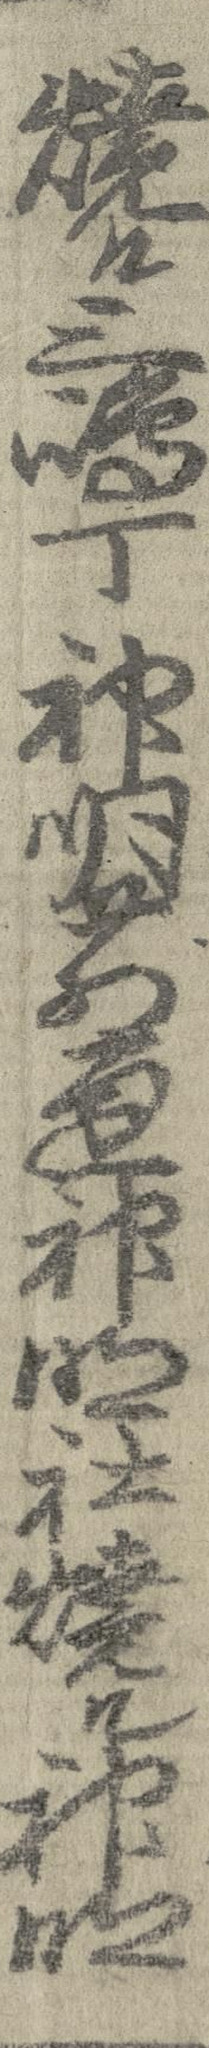焼ル三嶋丁神明前通神明社焼ル神明
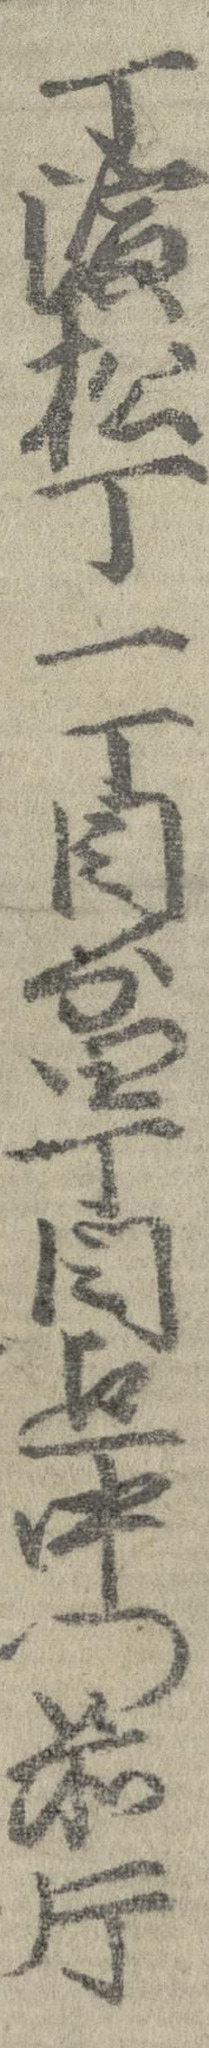丁浜松丁一丁目ゟ四丁目迄中門前片
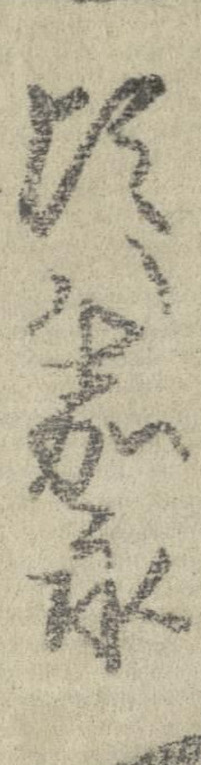頃は嘉永
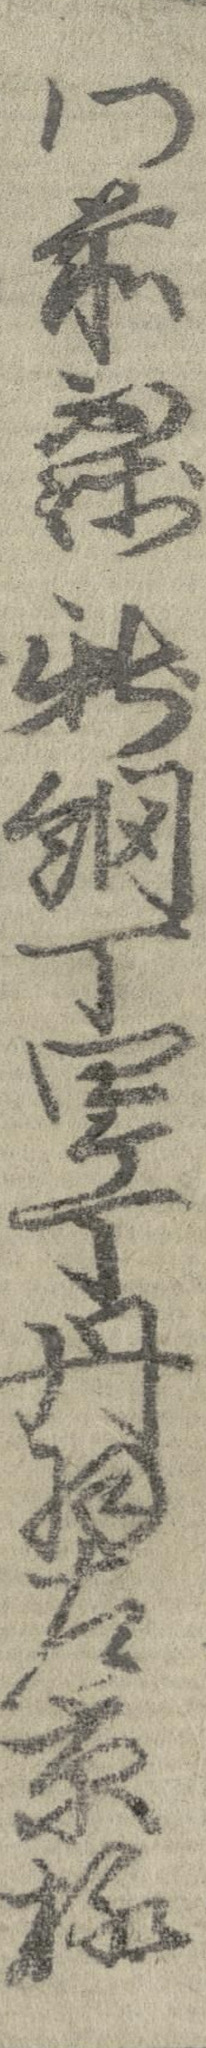門前不残新網丁田ケ丁丹羽左京様
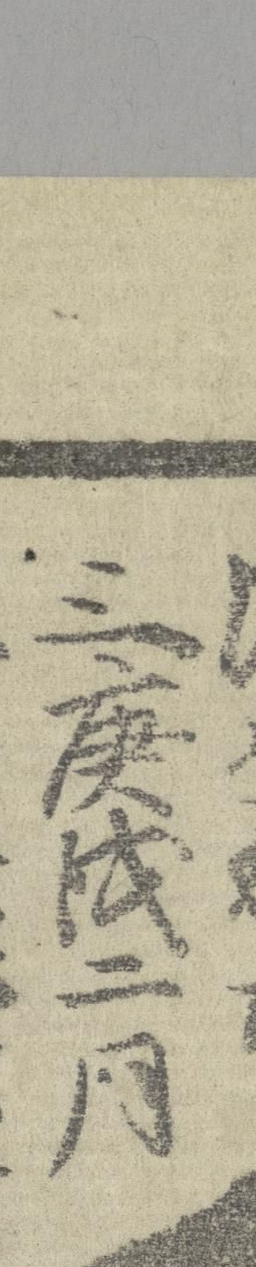三庚戌二月
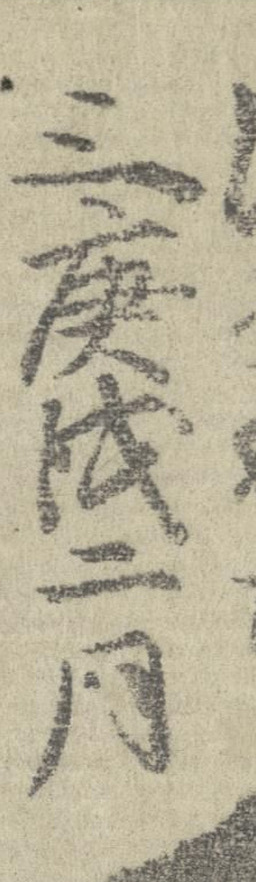三庚戌二月
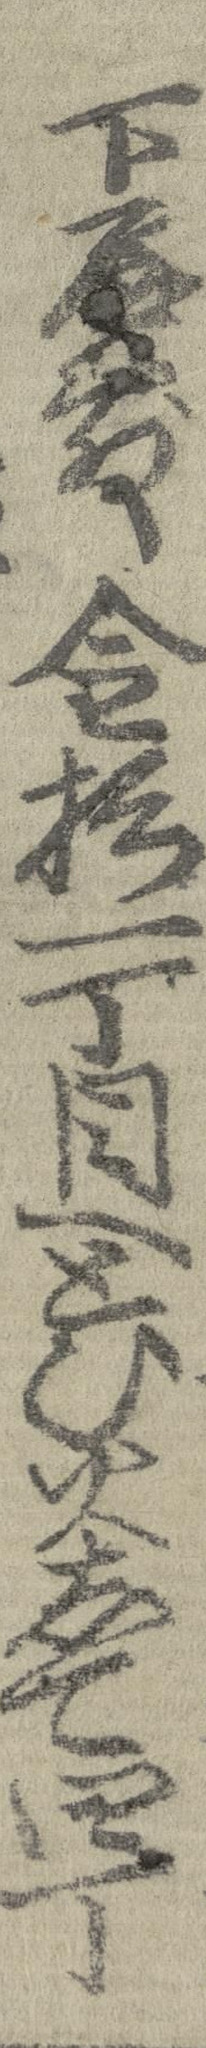下屋敷金杉丁一丁目へとひ火して四丁
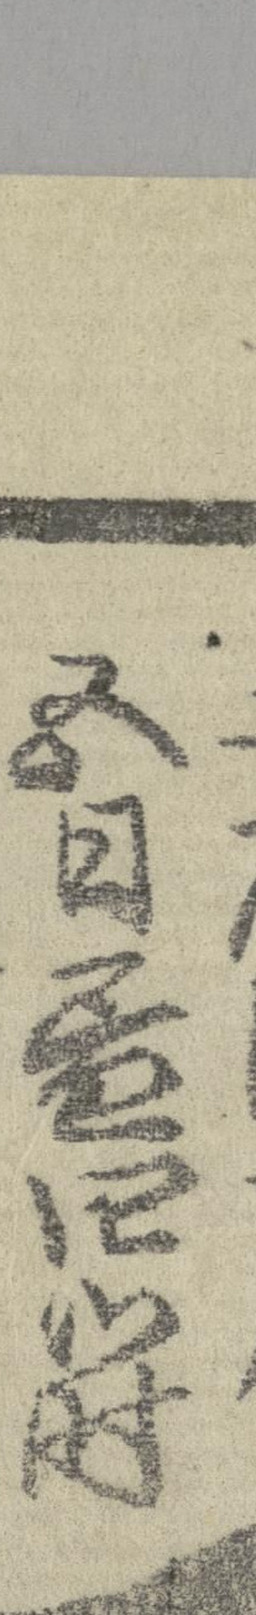五日昼四ツ時
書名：[嘉永三年二月の江戸大火に関する瓦版]
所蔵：東京大学地震研究所図書室 Earthquake Research Institute Library, The University of Tokyo, JAPAN
